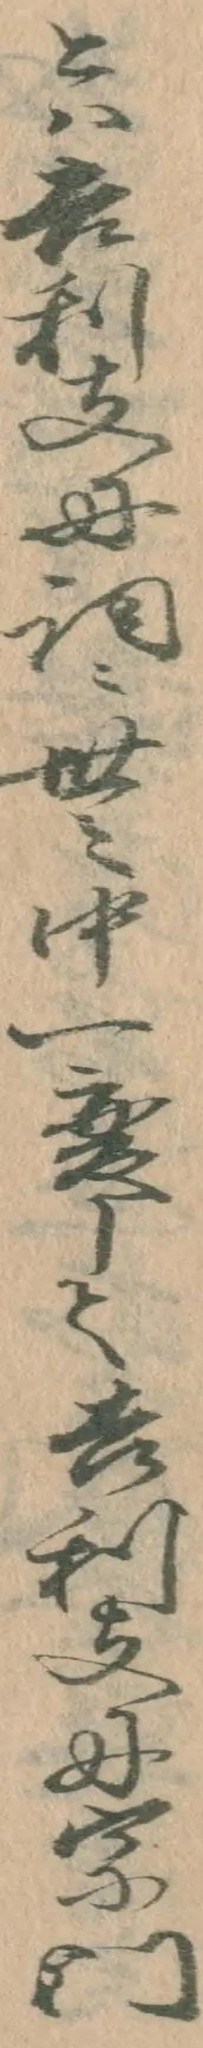とは吉利支丹詞に世之中一変して吉利支丹宗門
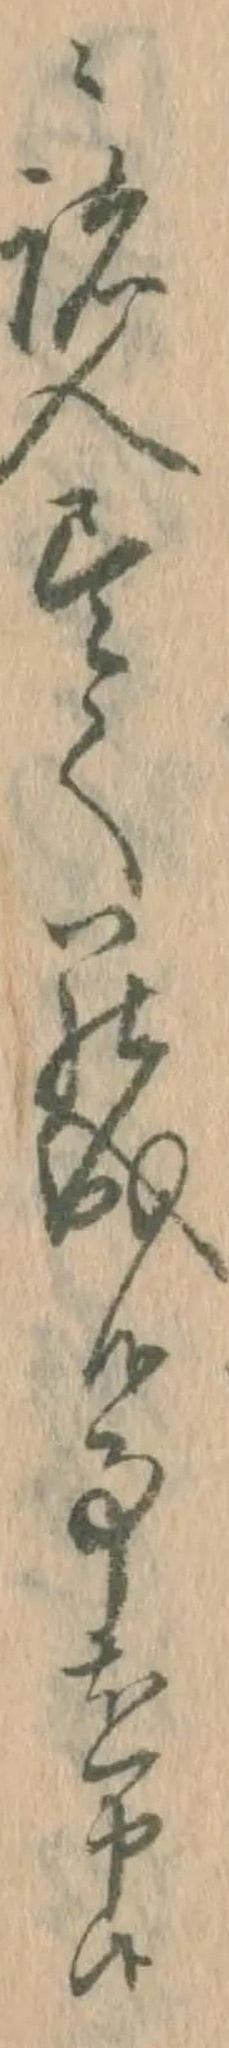に諸人尽て罷成候事を申候
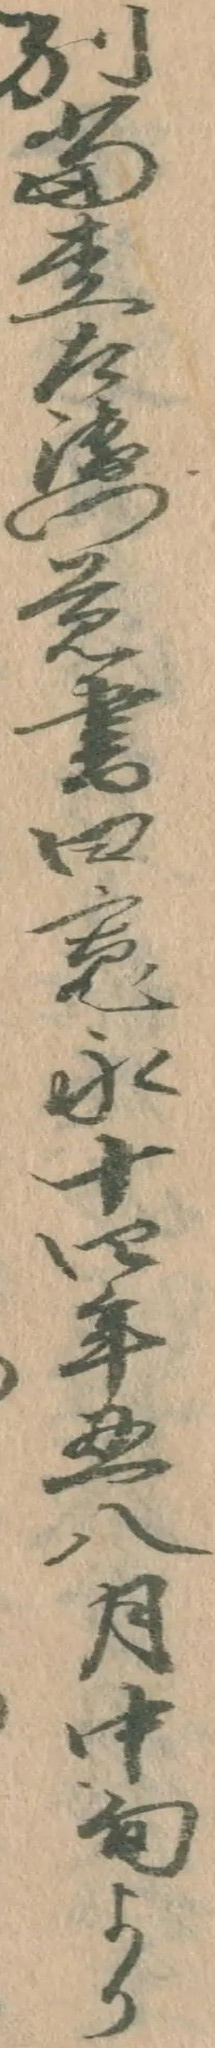別当杢左衛門覚書日寛永十四年丑八月中旬より
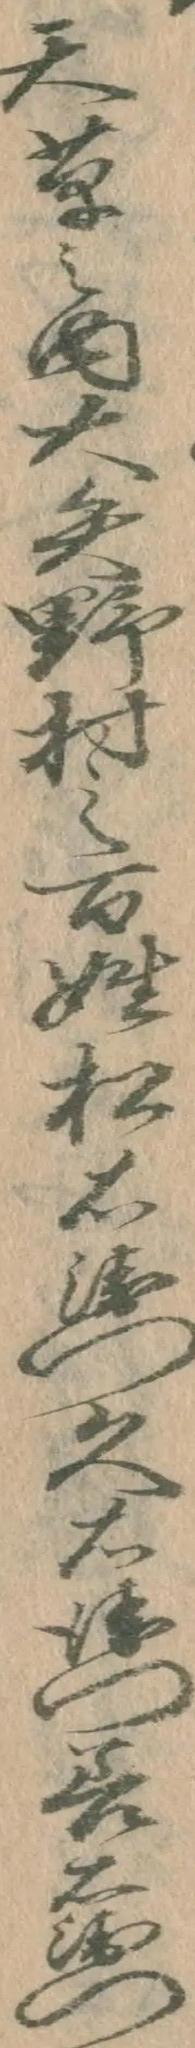天草之内大矢野村之百姓松右衛門久右衛門善右衛門
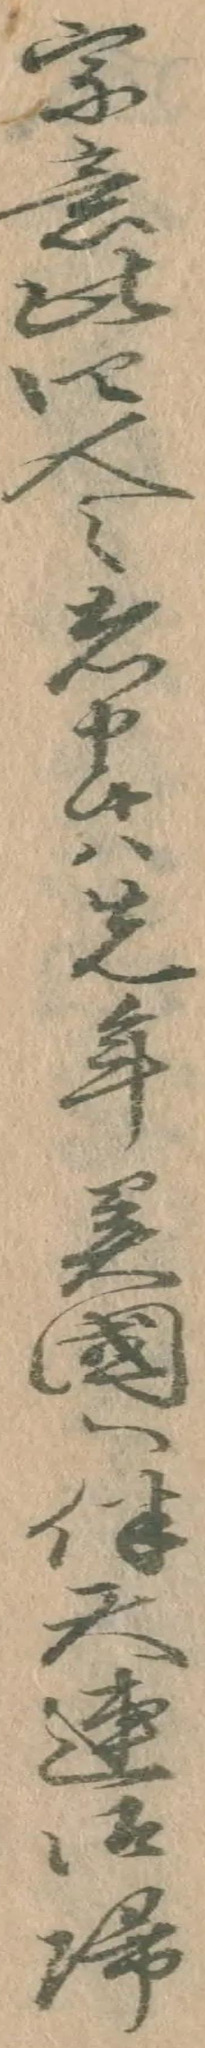宗意此四人之者申候は先年異国へ伴天連御帰
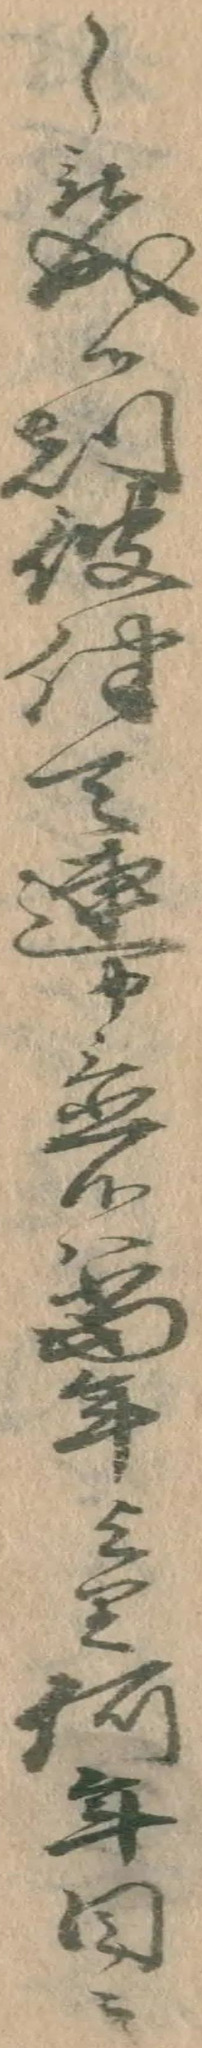し被成候刻彼伴天連申置候は当年より何年目に
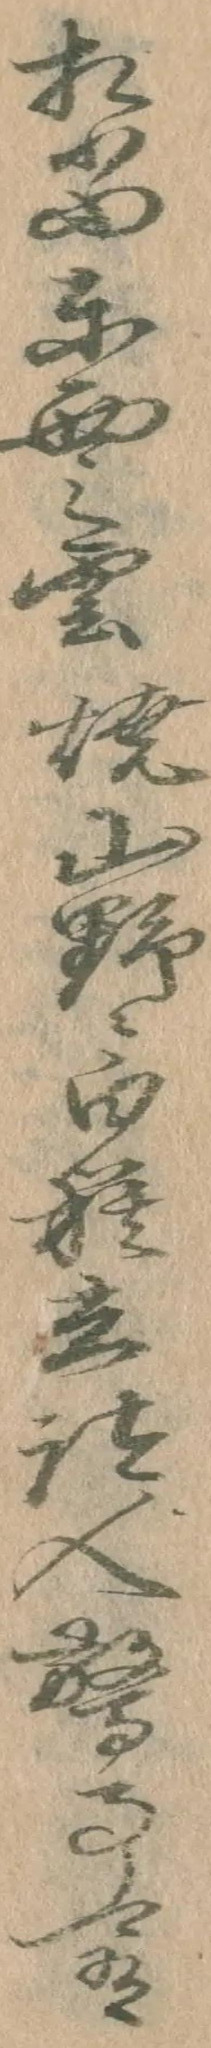相当東西之雲焼山野に白旗立諸人驚事可有
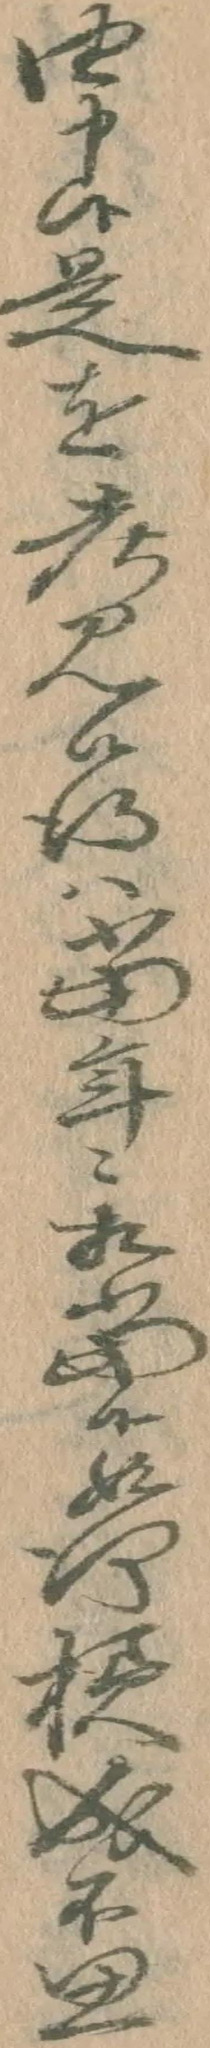由申候是を考見候得は当年に相当候如何様成不思
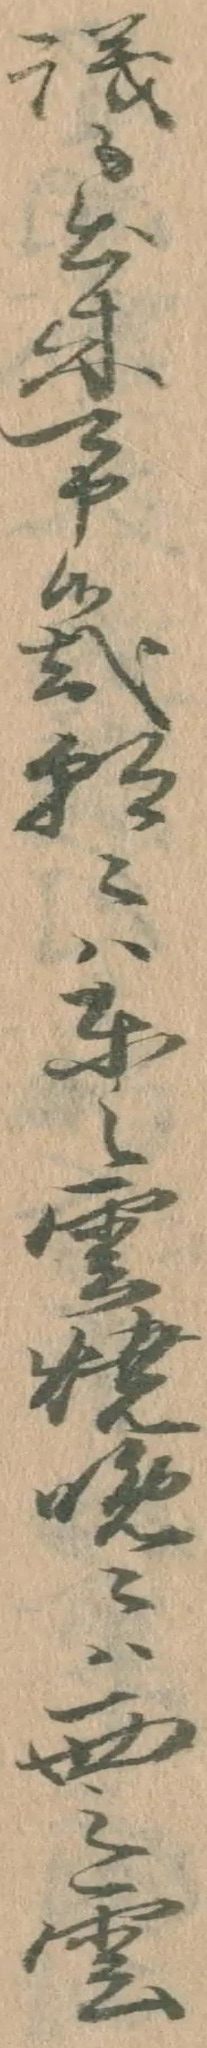議も出来可申候哉朝には東之雲焼晩には西之雲
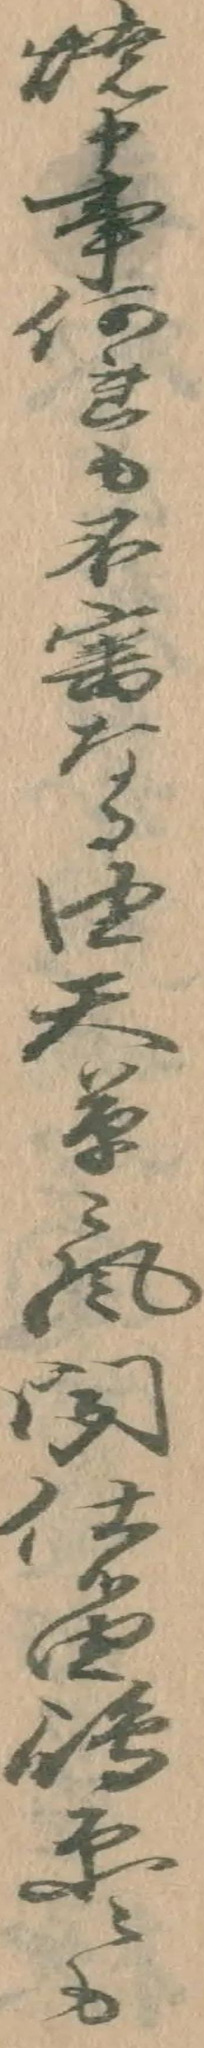焼申事何れも不審なる由天草に風聞仕候由島原にも
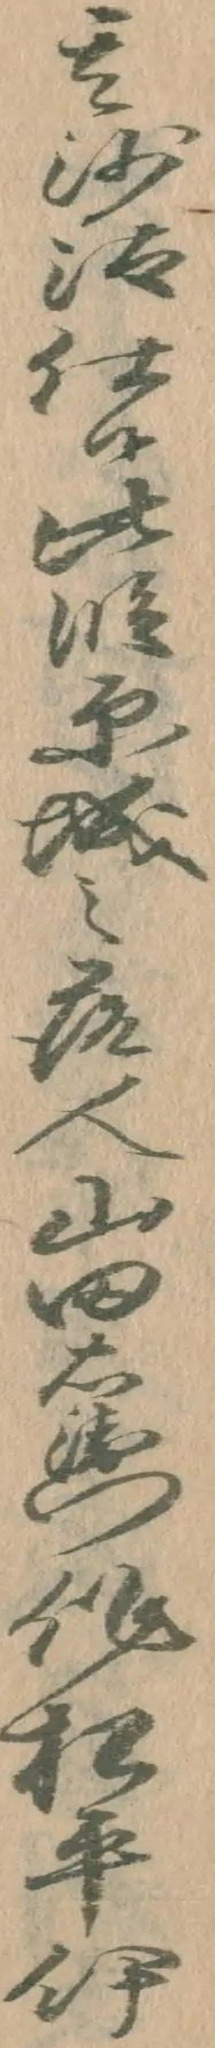其沙汰仕候此段原城之落人山田右衛門作松平伊
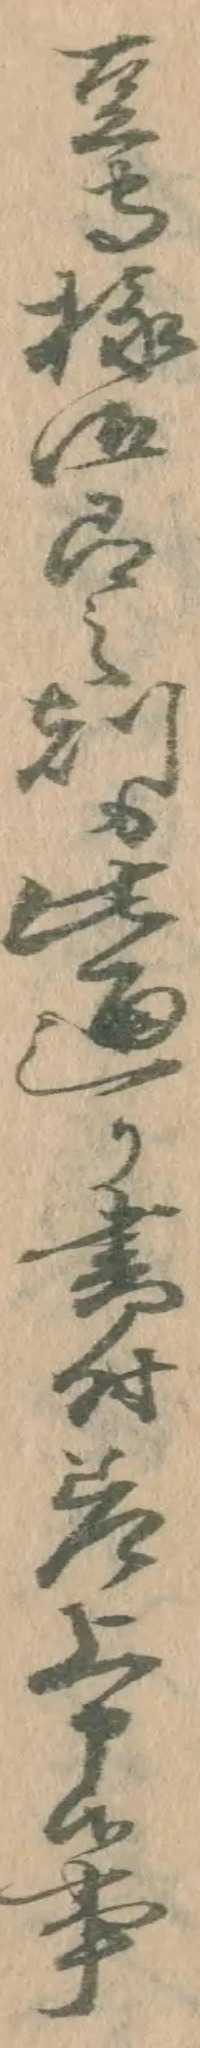豆守様御召之刻も此通り書付差上申候事
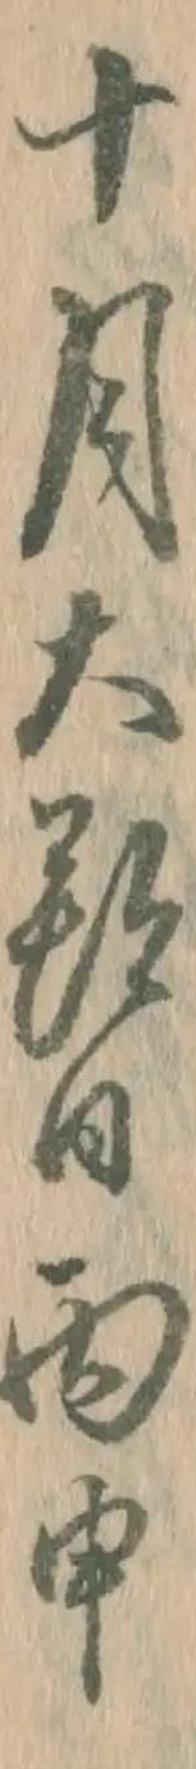十月大朔日丙申
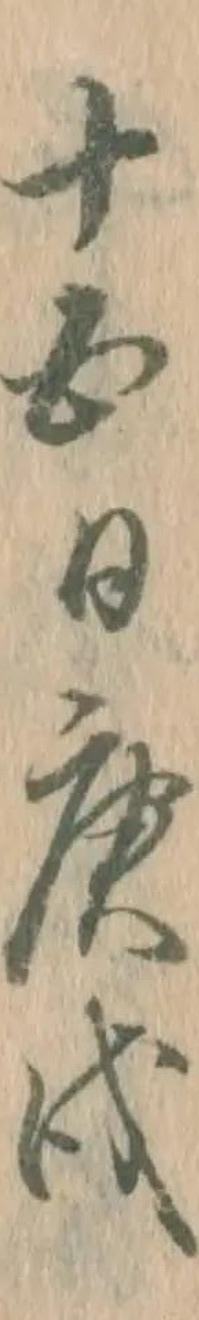十五日庚戌
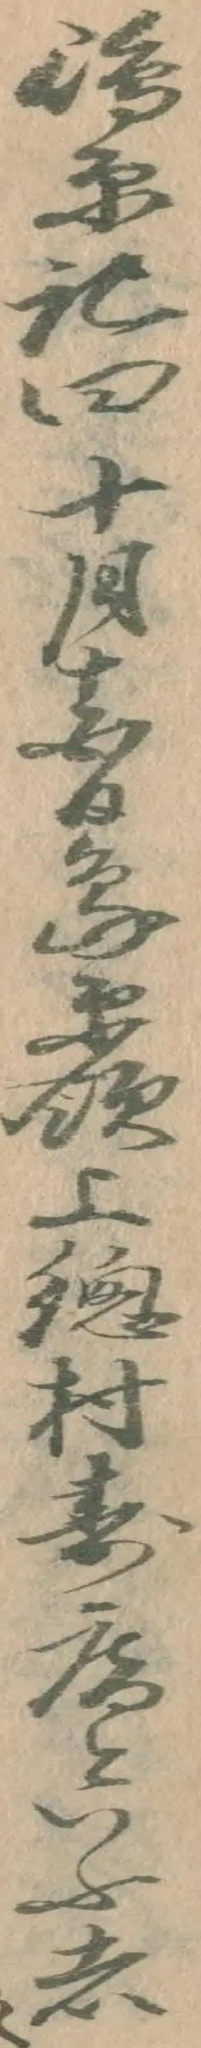島原記日十月十五日島原領上総村寿庵といふ者之
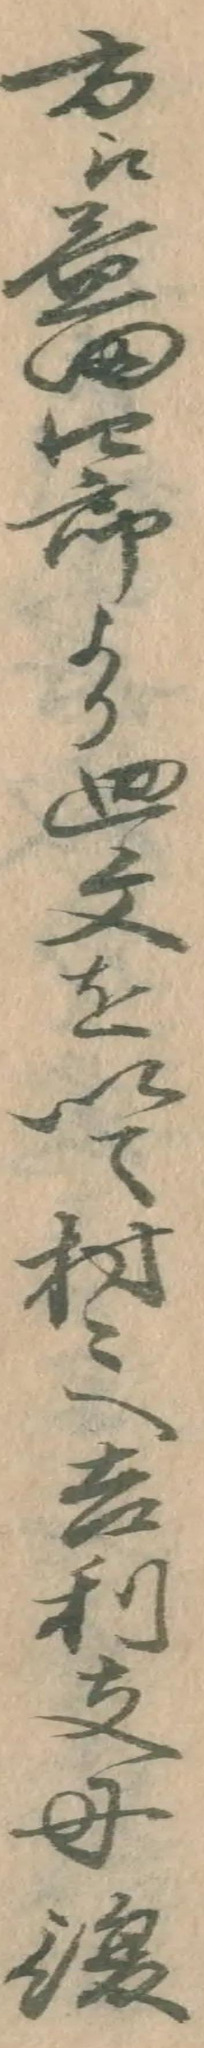方え益田四郎より廻文を以て村々へ吉利支丹復
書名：切支丹御退治記 49巻. [1]
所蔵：国立国会図書館 National Diet Library, JAPAN
